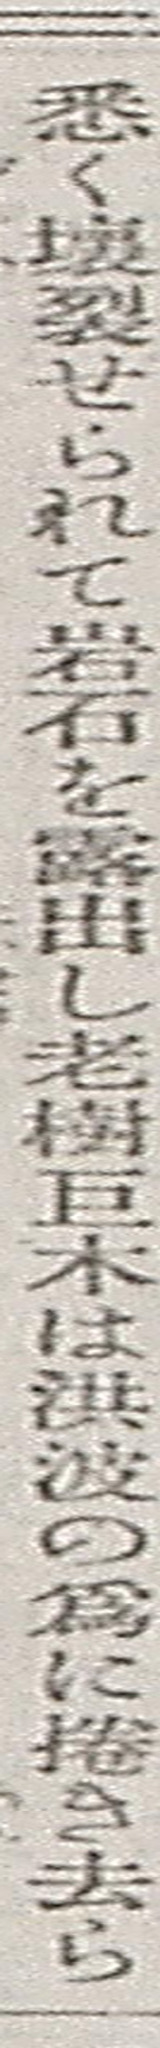悉く壊裂せられて岩石を露出し老樹巨木は洪波の為に捲きき去ら
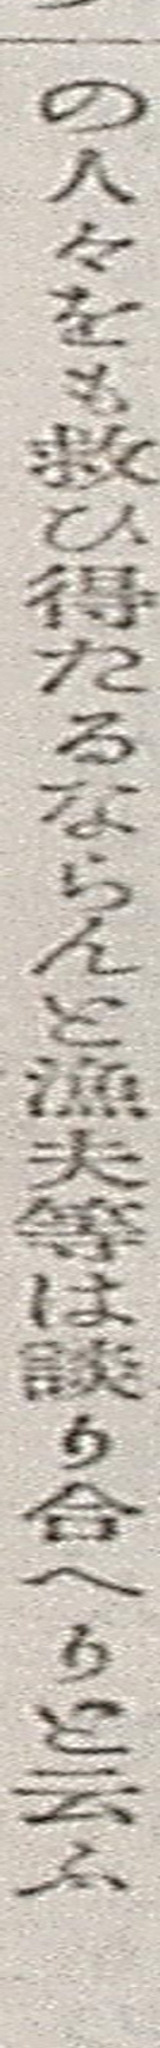の人々をも救ひ得たるならんと漁夫等は談り合へりと云ふ
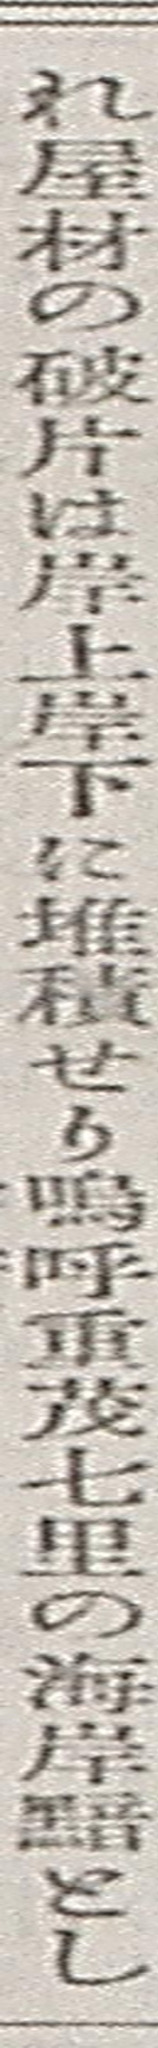れ屋材の破片は岸上岸下に堆積せり嗚呼重茂七里の海岸黯とし
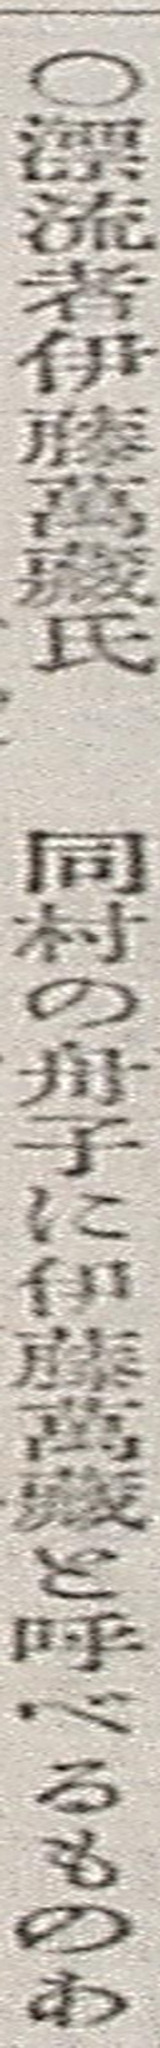○漂流者伊藤万蔵氏同村の舟子に伊藤万蔵と呼べるものあ
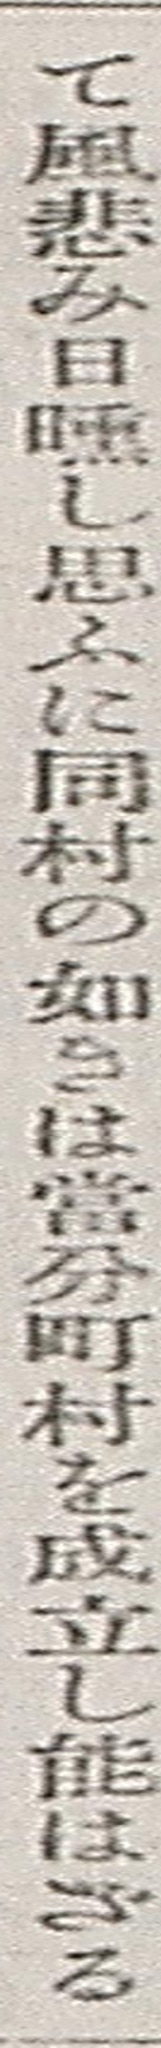て風悲み日曛し思ふに同村の如きは当分町村を成立し能はざる
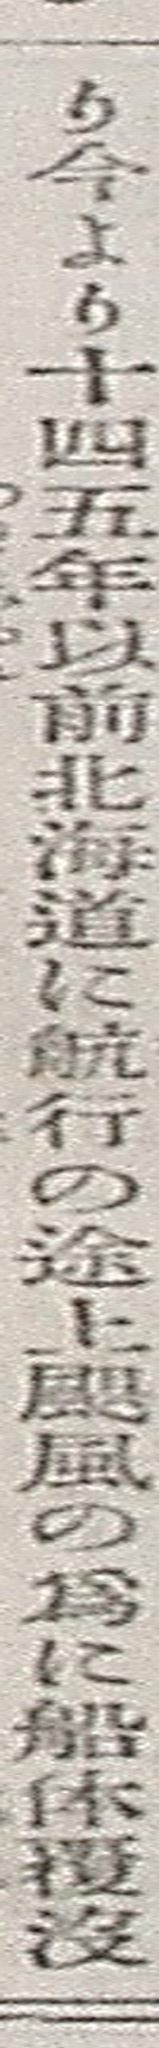り今より十四五年以前北海道に航行の途上颶風の為に船体覆没
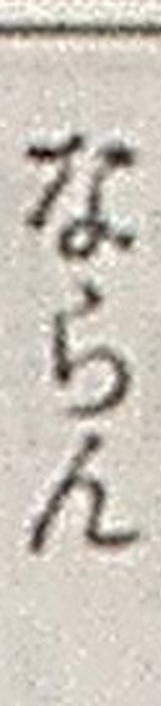ならん
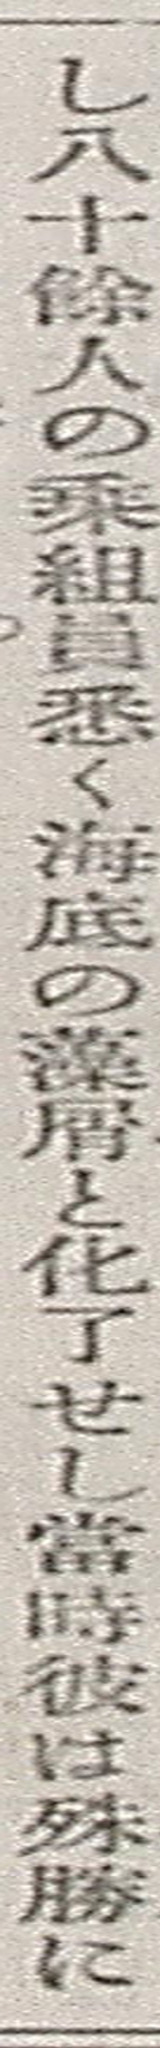し八十余人の乗組員悉く海底の藻屑と化了せし当時彼は殊勝に
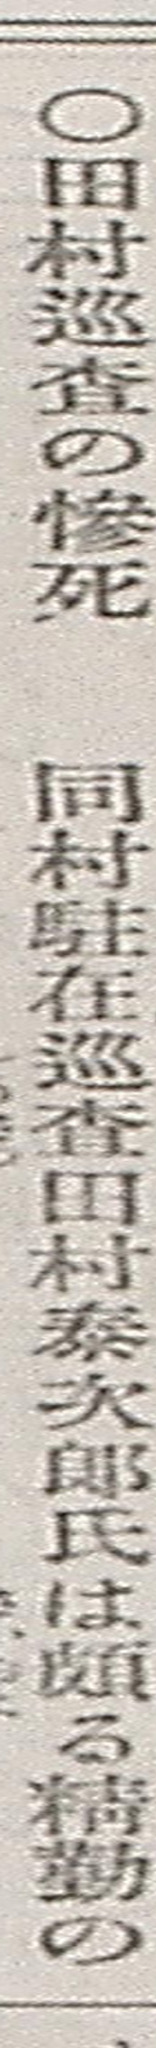○田村巡査の惨死同村駐在巡査田村泰次郎氏は頗る精勤の
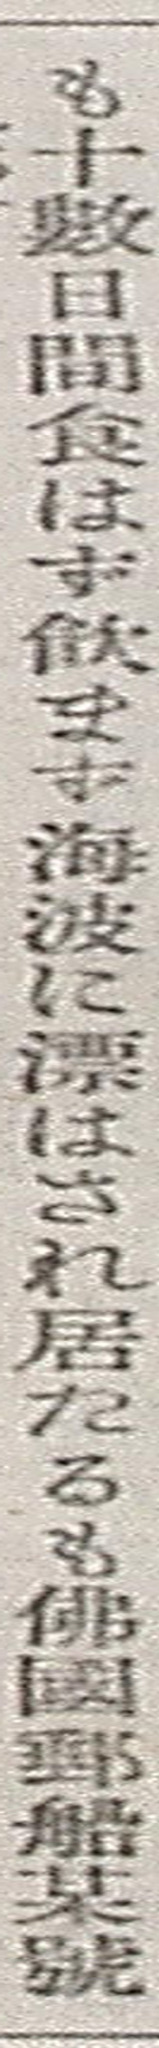も十数日間食はず飲まず海波に漂はされ居たるも仏国郵船某号
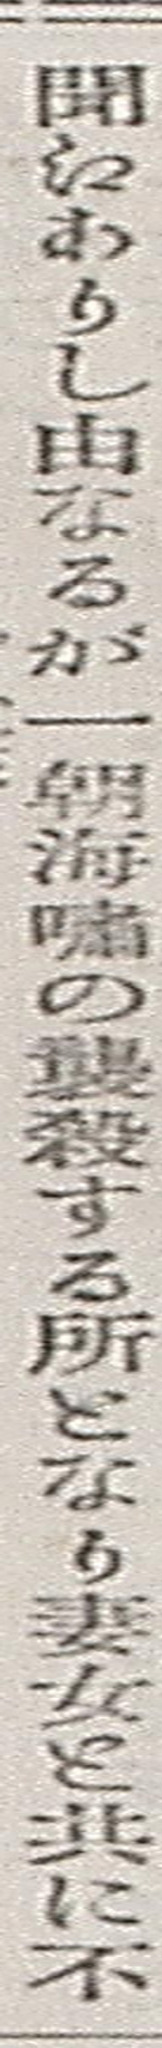聞えありし由なるが一朝海嘯の襲殺する所となり妻女と共に不
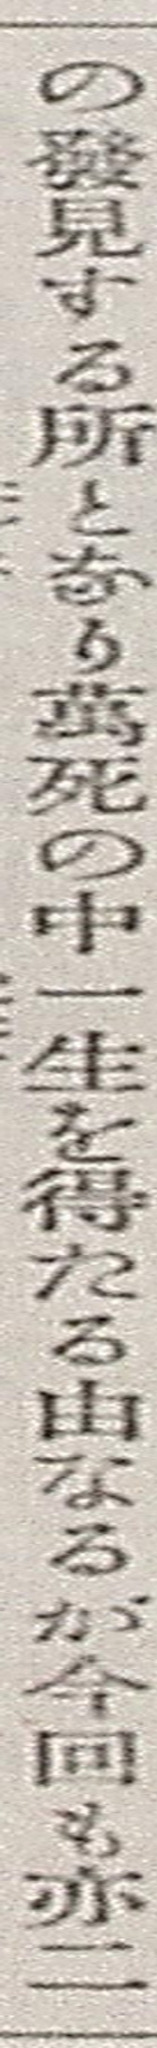の発見する所となり万死の中一生を得たる由なるが今回も亦二
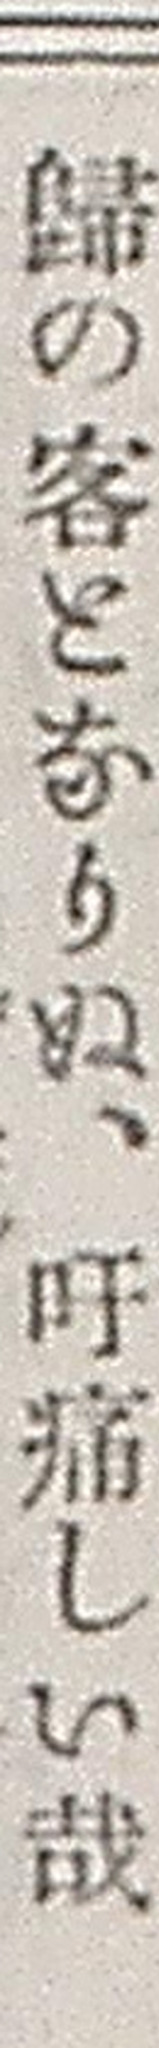帰の客となりぬ、吁痛しい哉
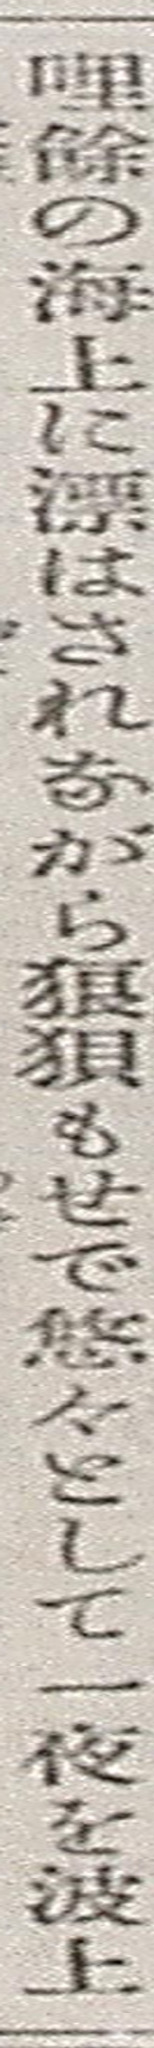哩余の海上に漂はされながら狼狽もせで悠々として一夜を波上
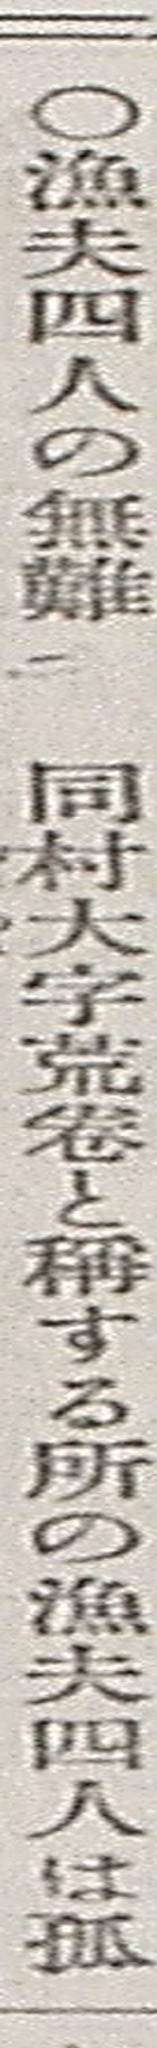○漁夫四人の無難同村大字荒巻と称する所の漁夫四人は孤
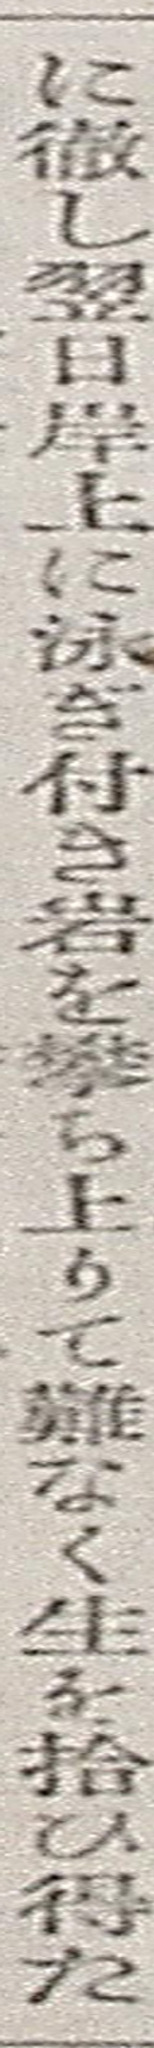に徹し翌日岸上に泳ぎ付き岩を攀ち上りて難なく生を拾ひ得た
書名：風俗畫報臨時増刊第百十九號　大海嘯被害録（中）
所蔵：東京大学地震研究所図書室 Earthquake Research Institute Library, The University of Tokyo, JAPAN
